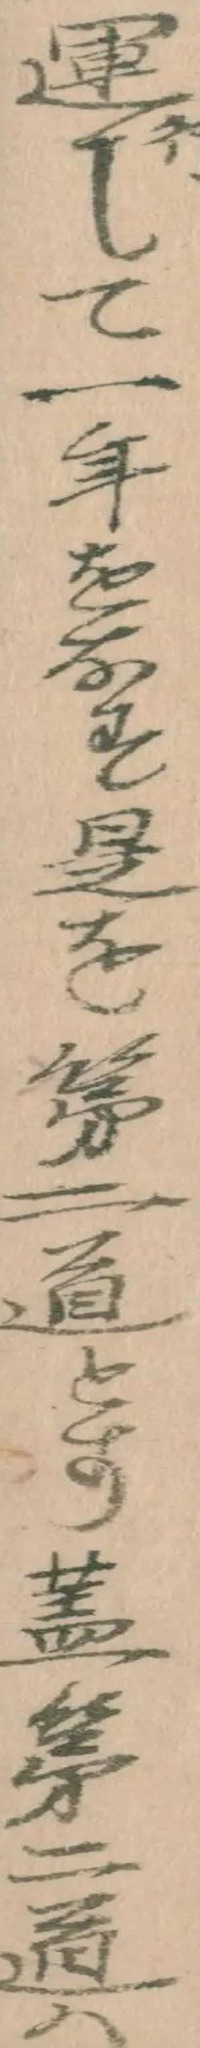運行して一年をなす是を第二道とす蓋第二道ハ
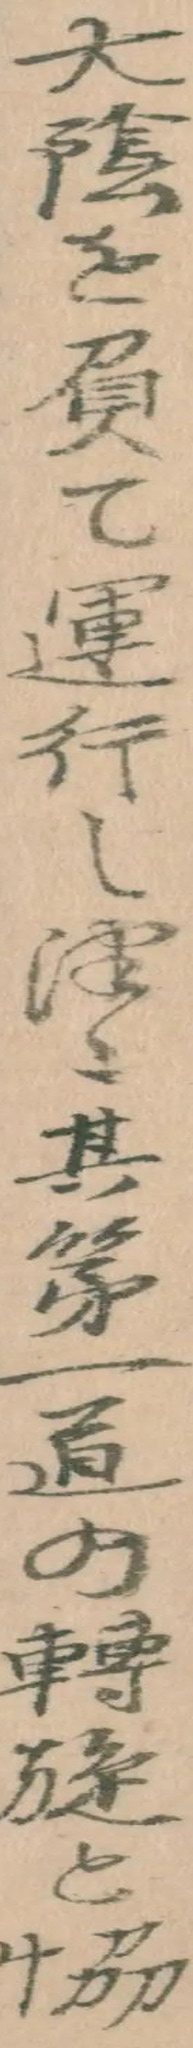大陰を負て運行しつゝ其第一道の転旋と協
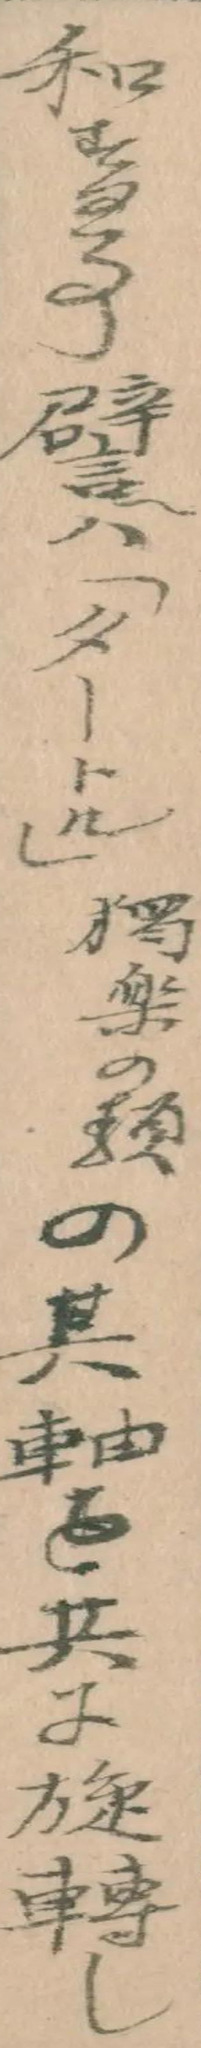和する事譬ハ「タートル」独楽の類の其軸を共に旋転し
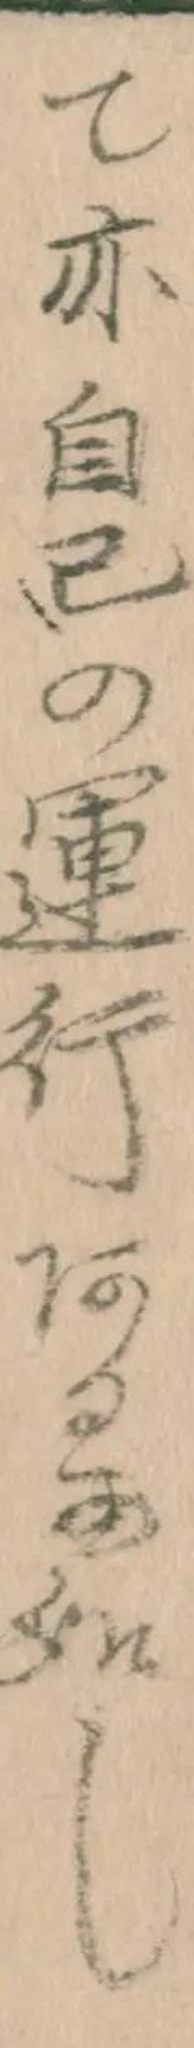て亦自己の運行あるか如し
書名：新釈輿地図説
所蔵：国立国会図書館 National Diet Library, JAPAN
